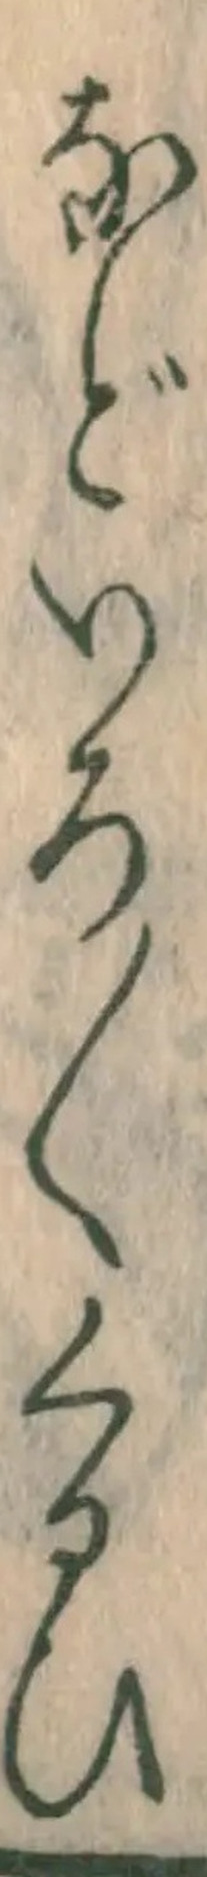などいろ〳〵くるひ
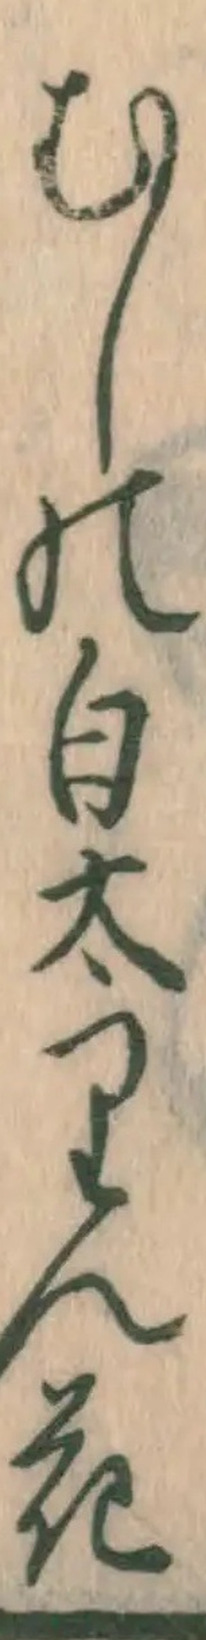むしの白太りん花
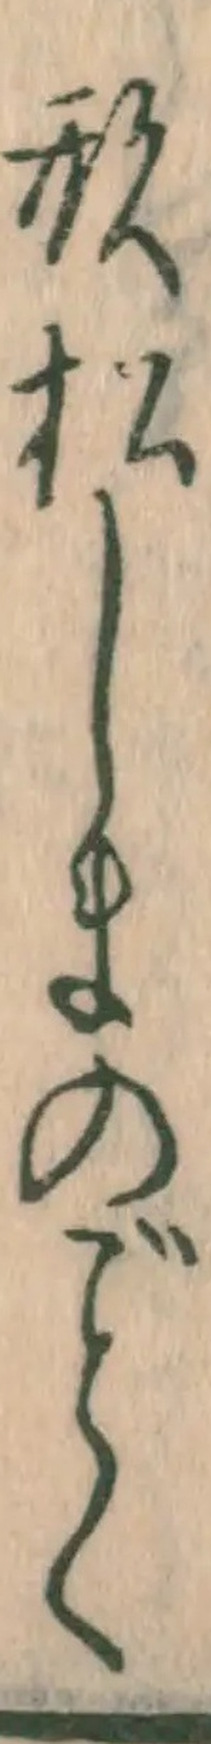形松しまのごとく
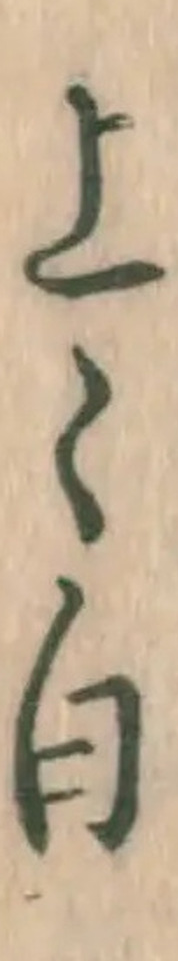上々白
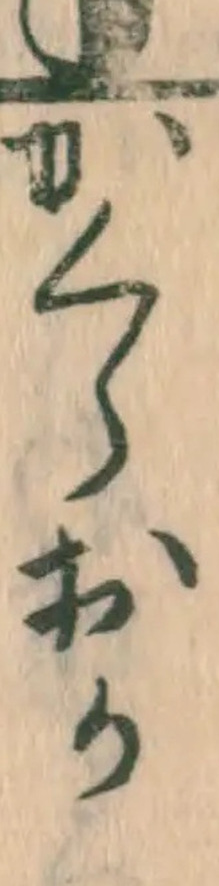かくらおか
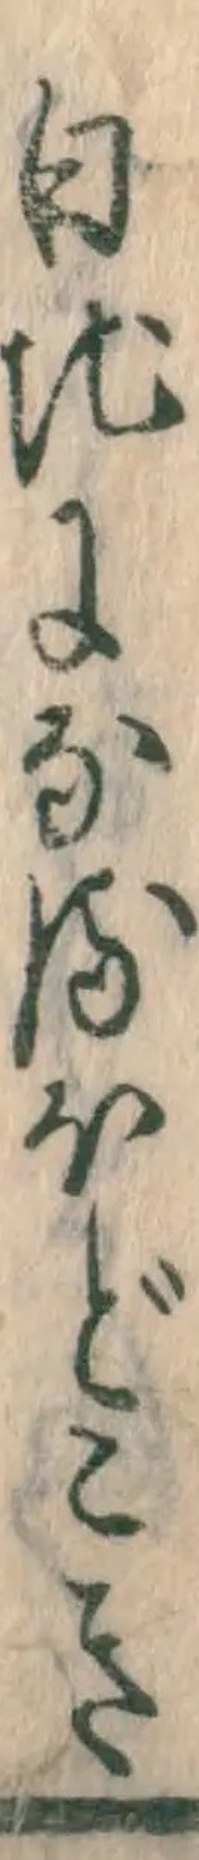白地になるほどこき
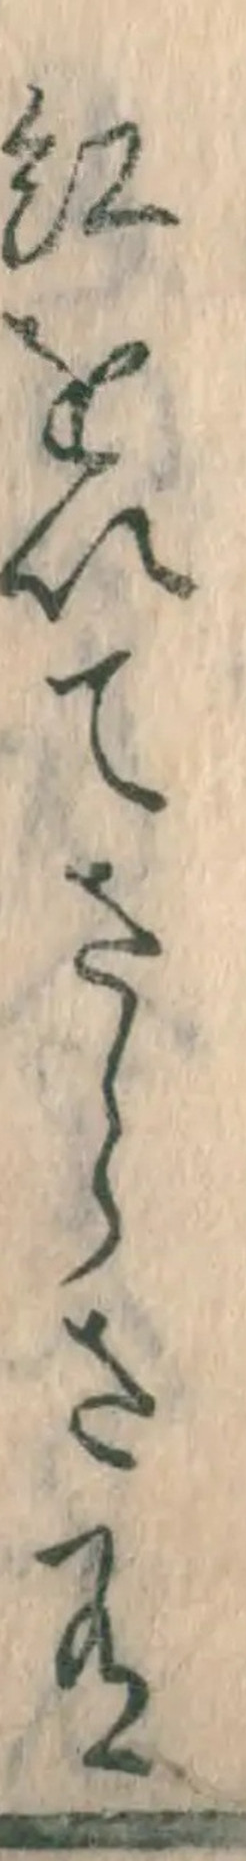紅を以てさらさ有
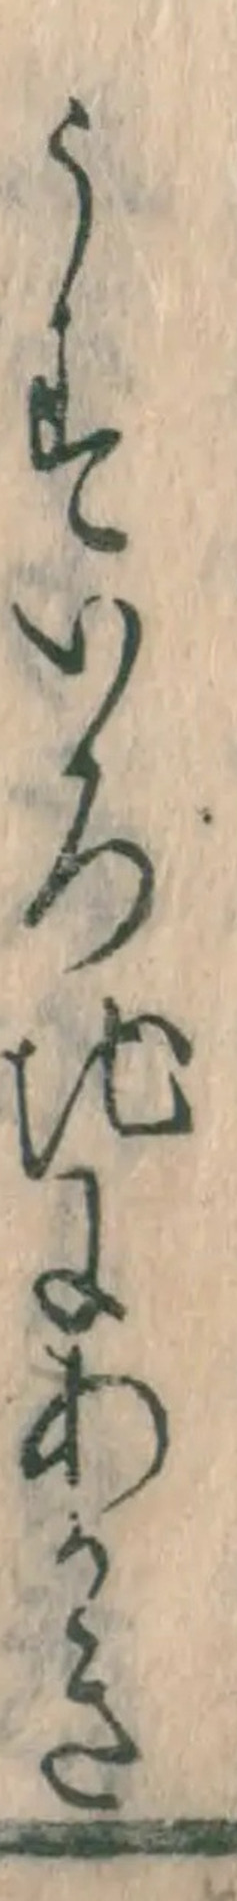うすいろ地にあかき

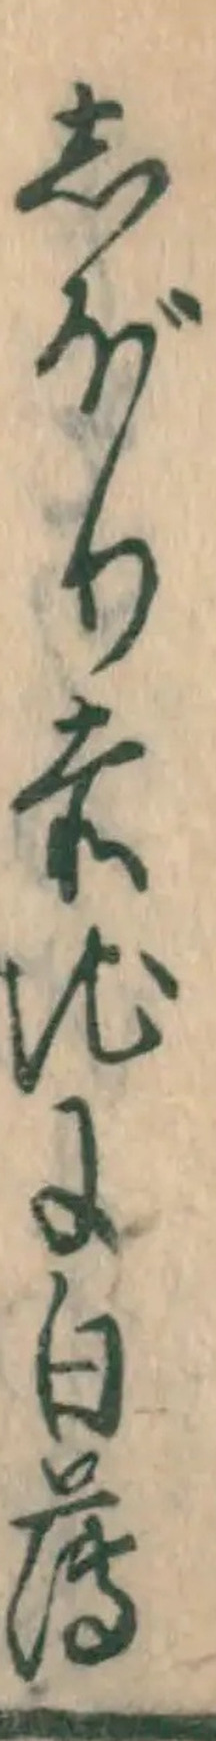しぼり赤字に白薄
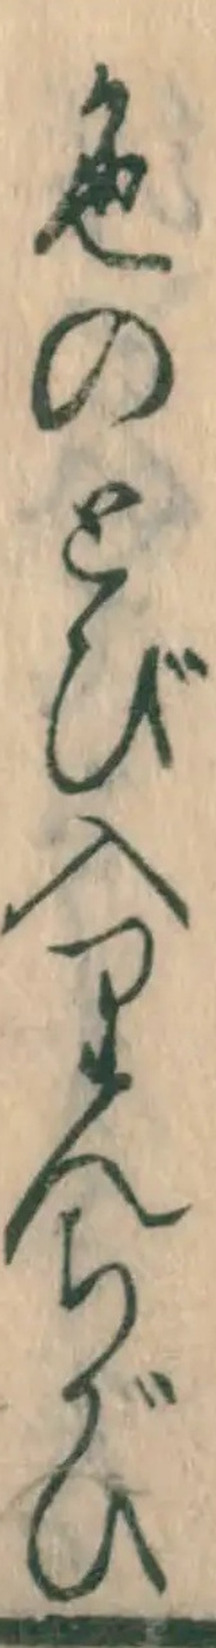色のとび入りんちがひ
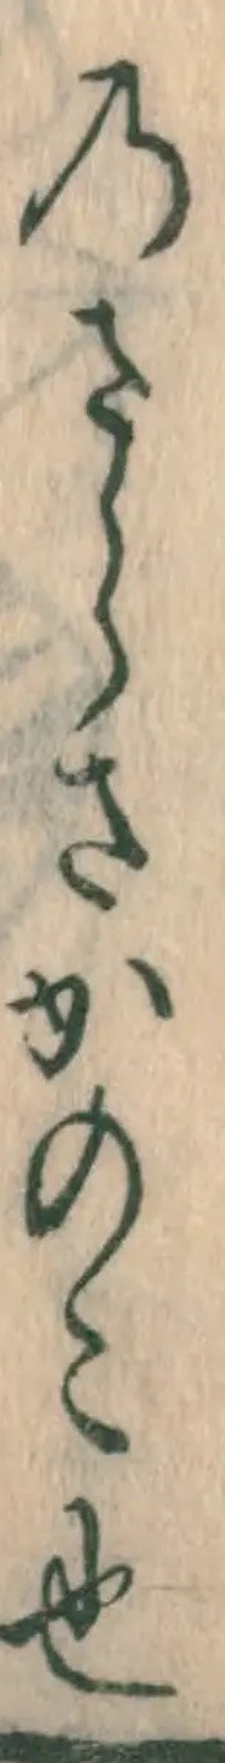のさらさかのこ也
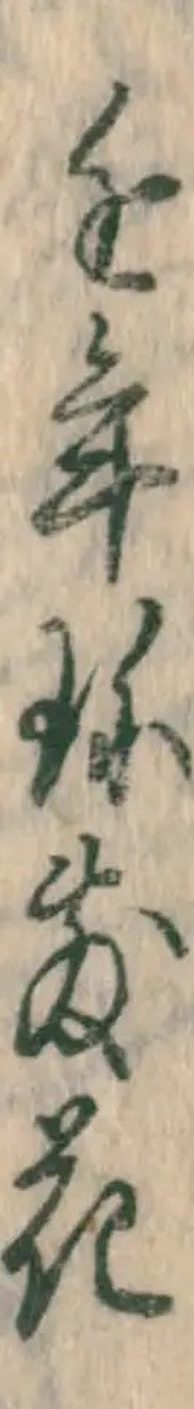近年珍敷花
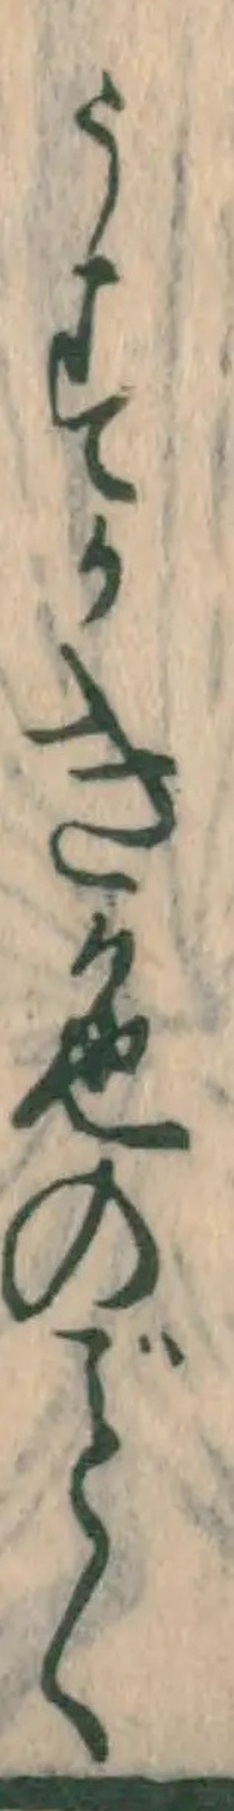うすかき色のごとく
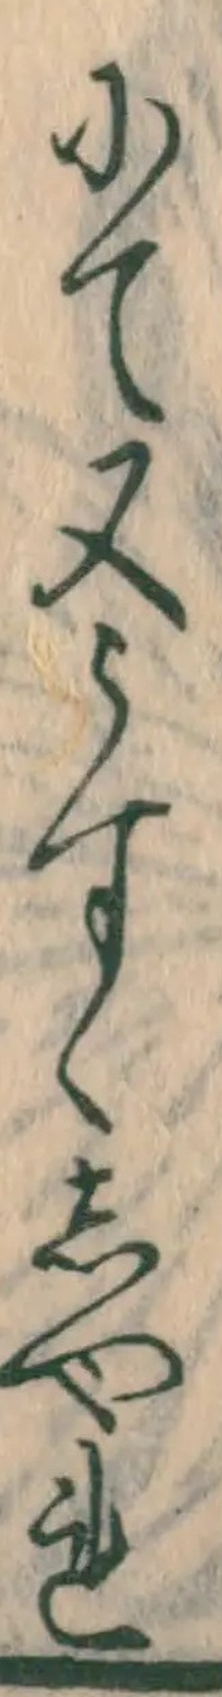にて又うすくしやれ
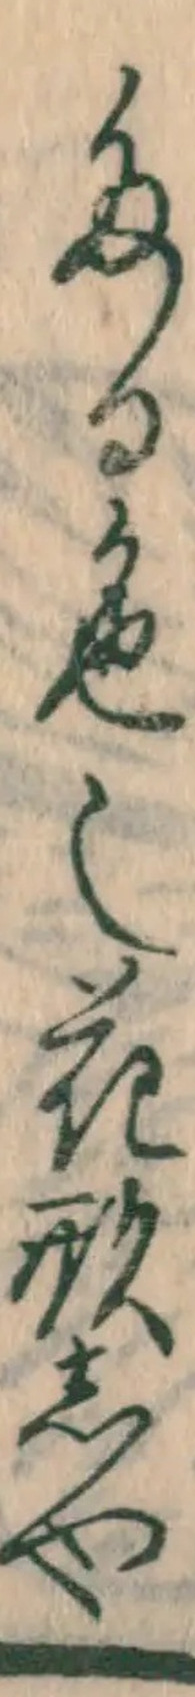たる色也花形しや
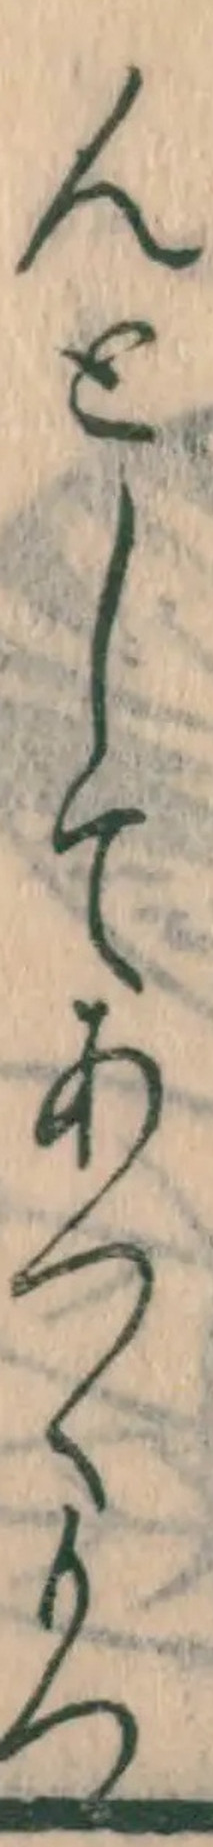んとしてあつくもつ
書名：錦繍枕 5巻. [5]
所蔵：国立国会図書館 National Diet Library, JAPAN
